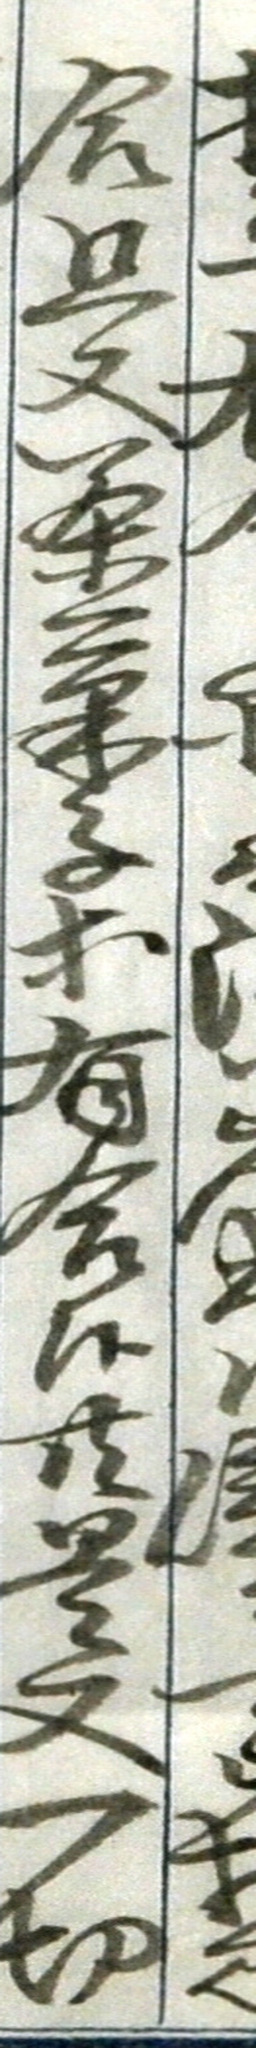合且又茶菓子等有合候共是又一切
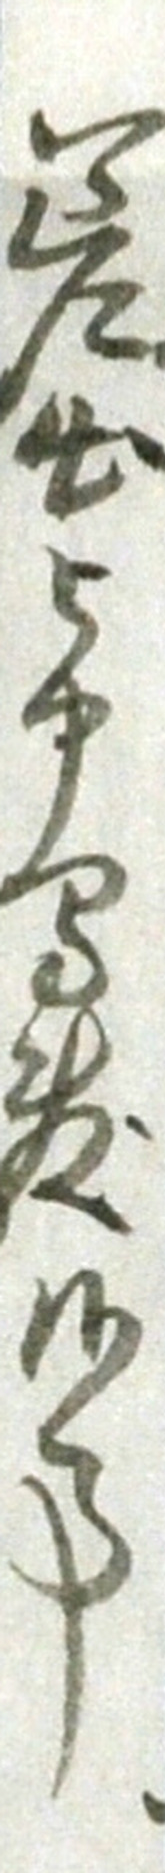差出被申間敷候事
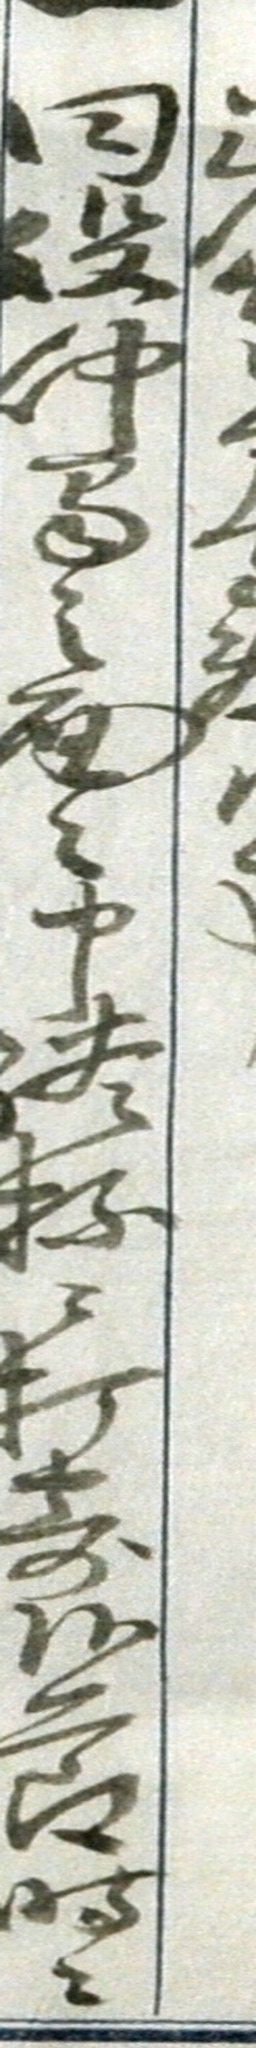一同役仲間之面々申談抔ニ打寄候節時々
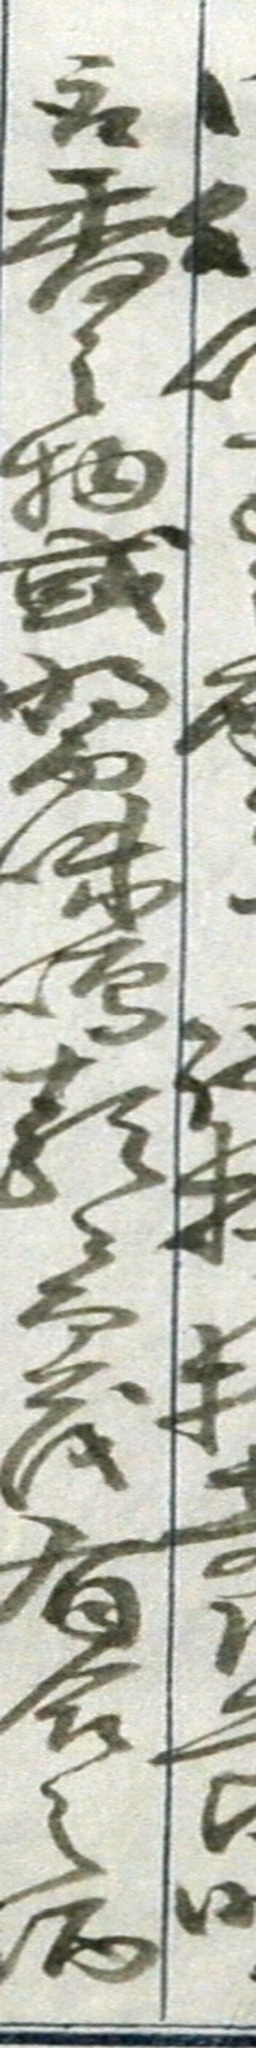取香之物或醤味噌類ニ而も有合之酒
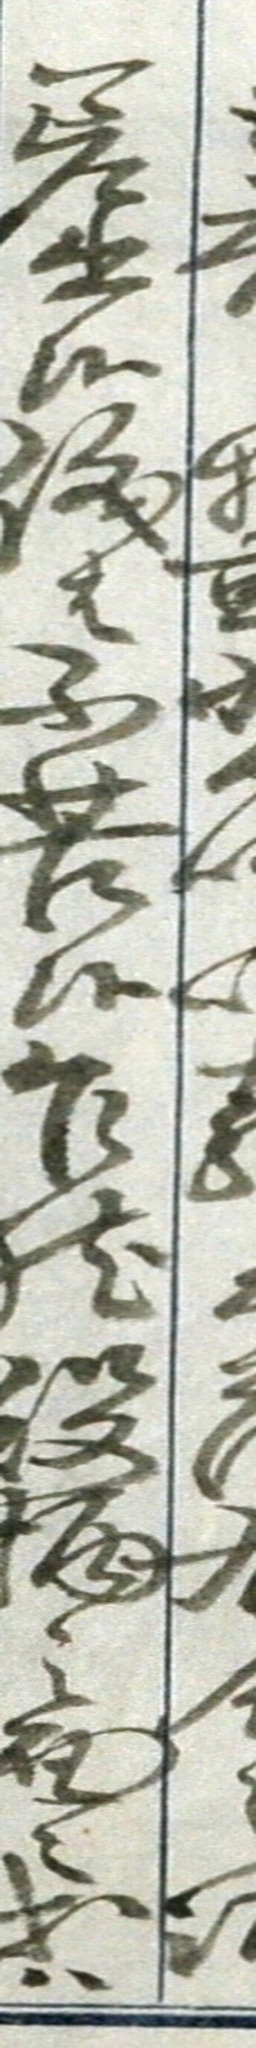差出候儀は不苦候乍然役柄之面々等は
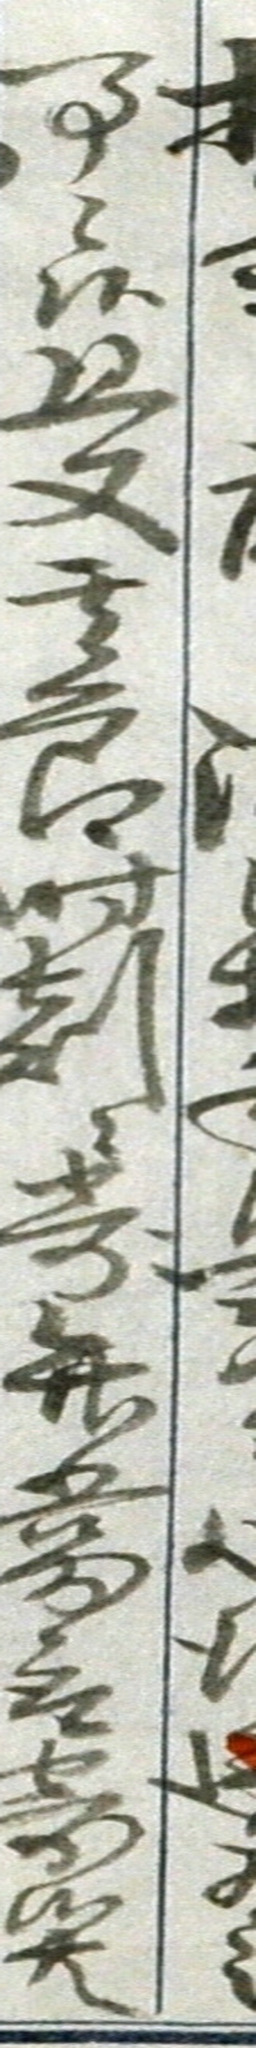事ニ候且又其節時刻ニ寄弁当取寄候共
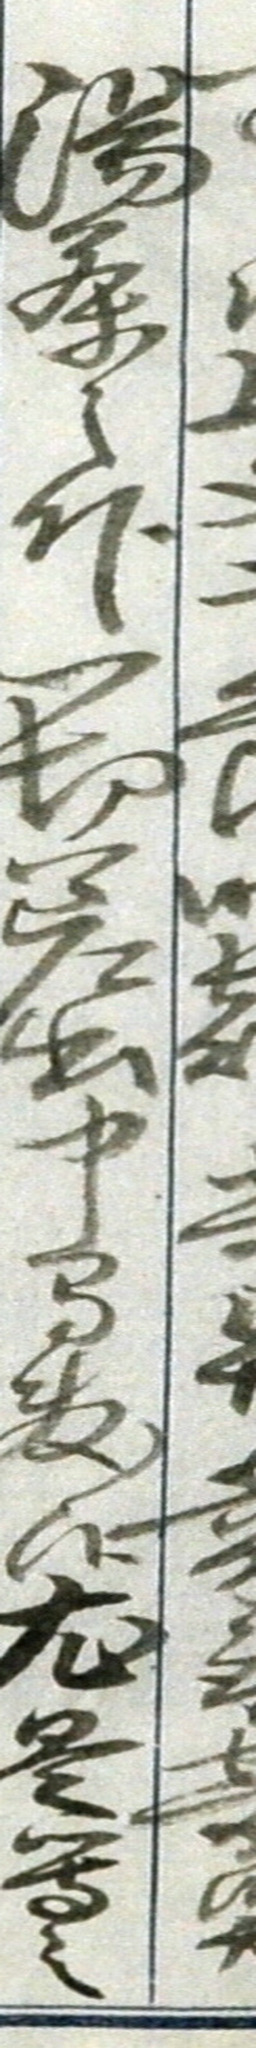湯茶之外一切差出申間敷候尤是等之
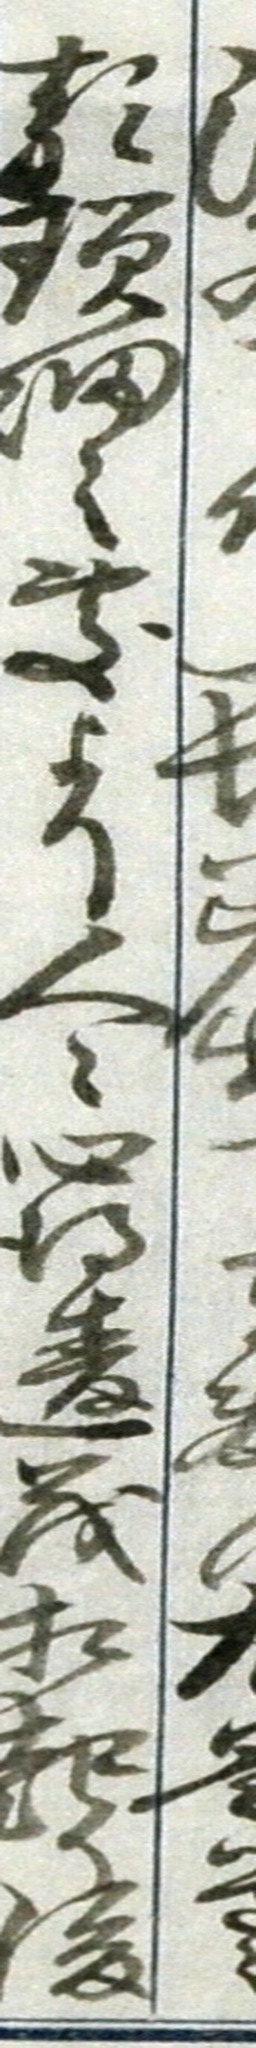類瑣細之処より人々心得違も相起り後
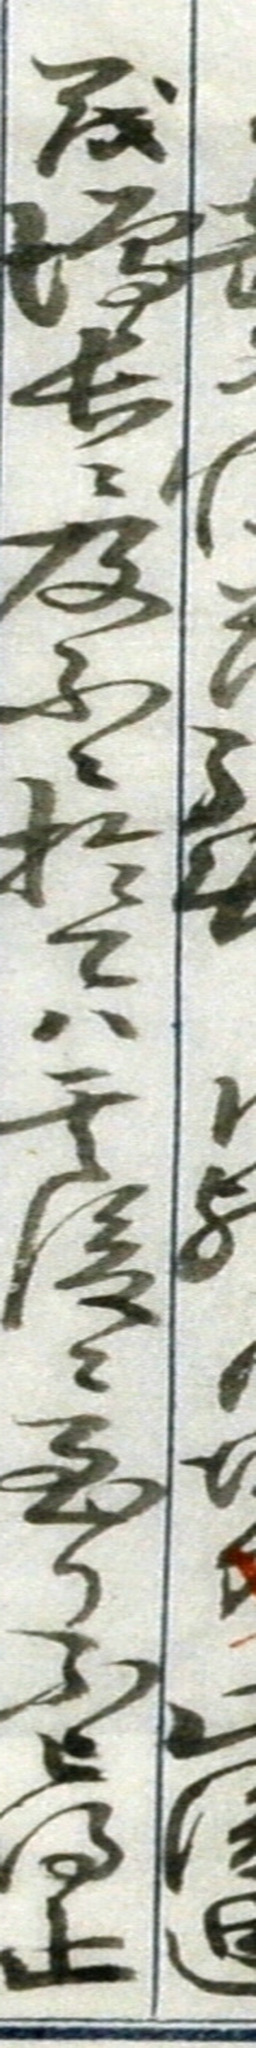も増長ニ及ふニ於てハ其後ニ至り不被得止
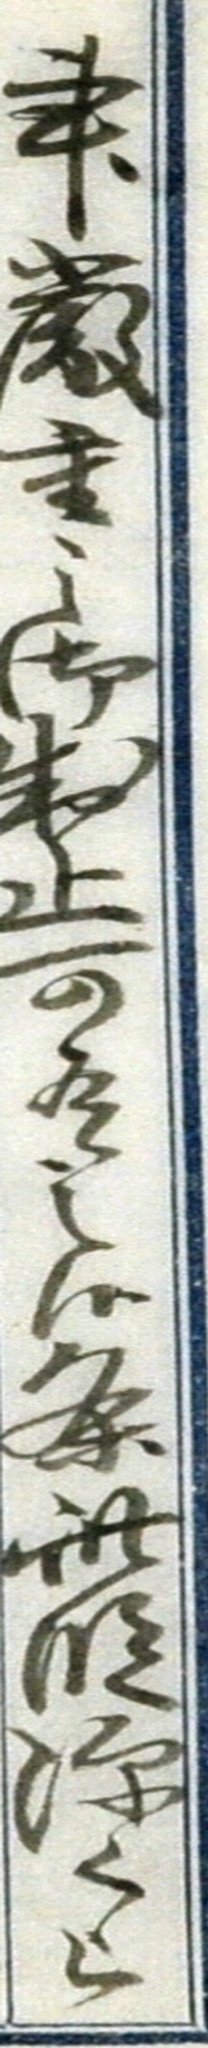事厳重之御制止可有之候条此段深く被
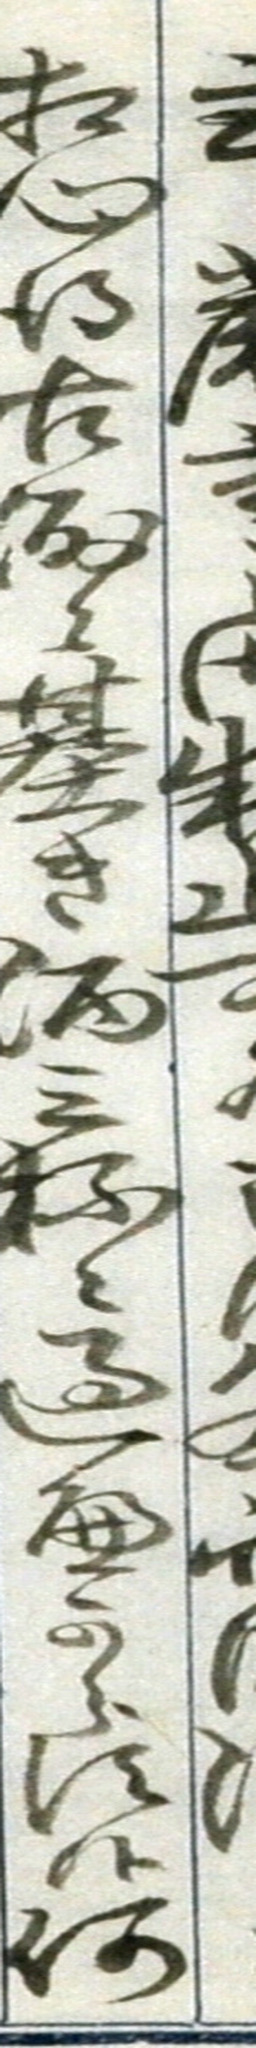相心得古例ニ基き酒三杯ニ過へからす候何
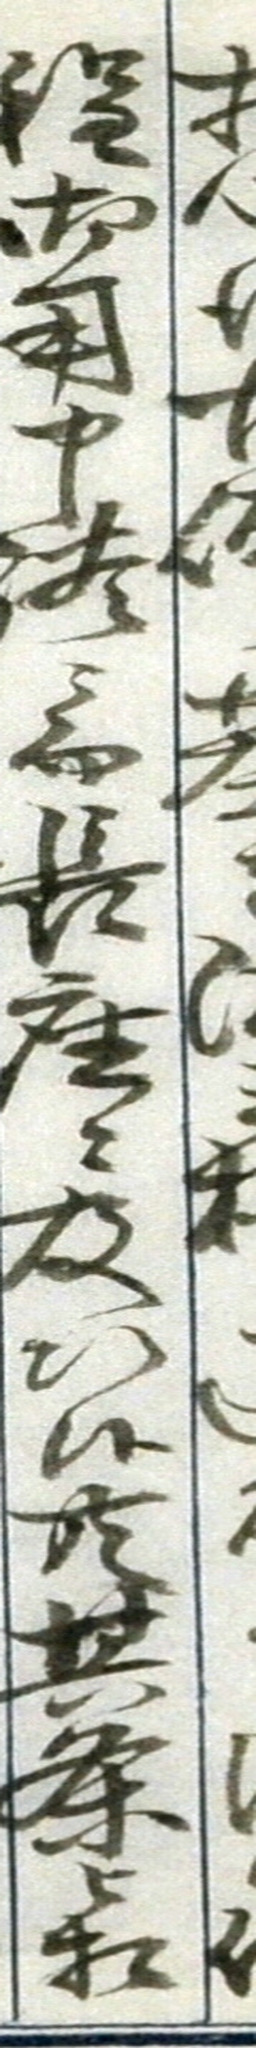程御用申談ニ而長座ニ及ひ候共其条被相
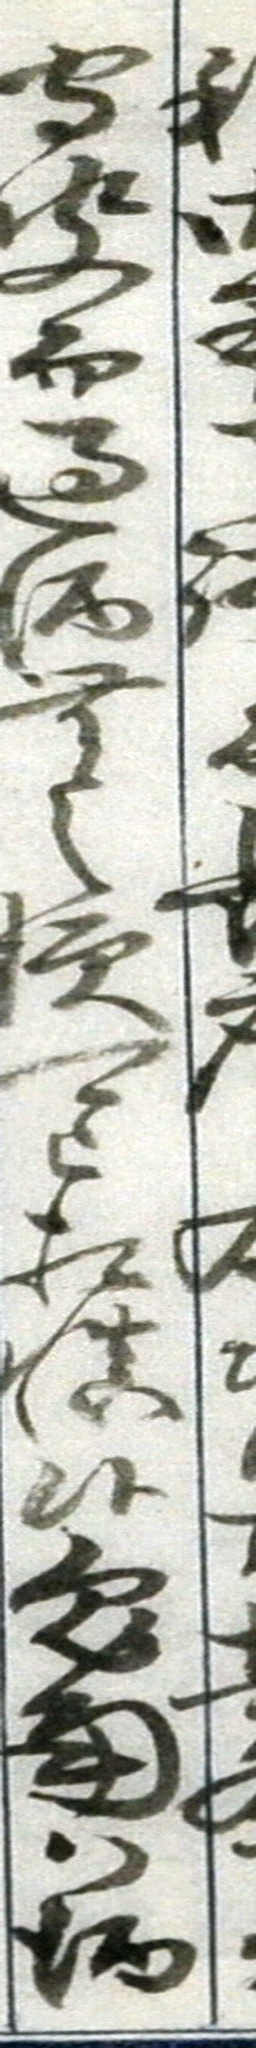守決而過酒無之様可被相慎候兎角ハ酒
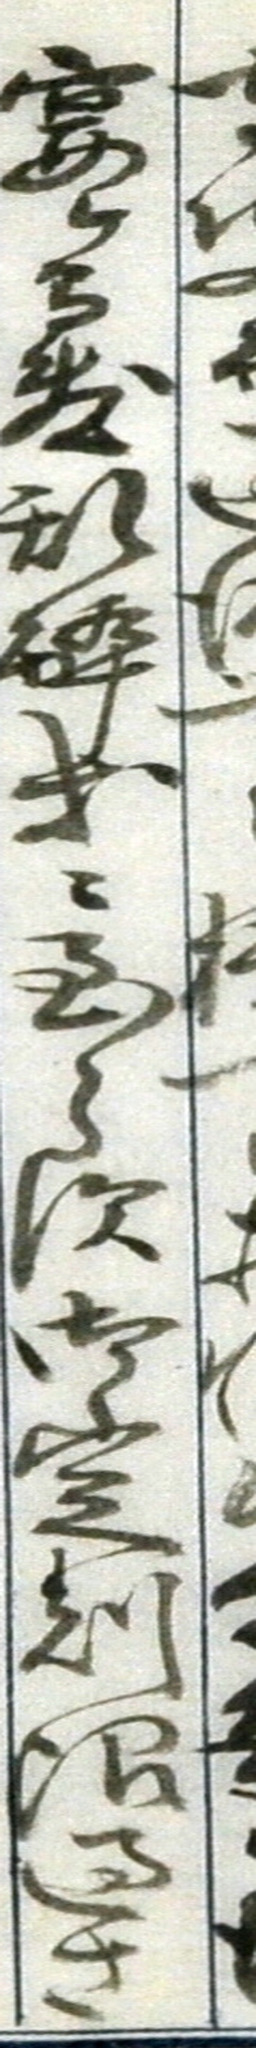宴ヶ間敷乱酔等ニ至らす御定刻限過さ
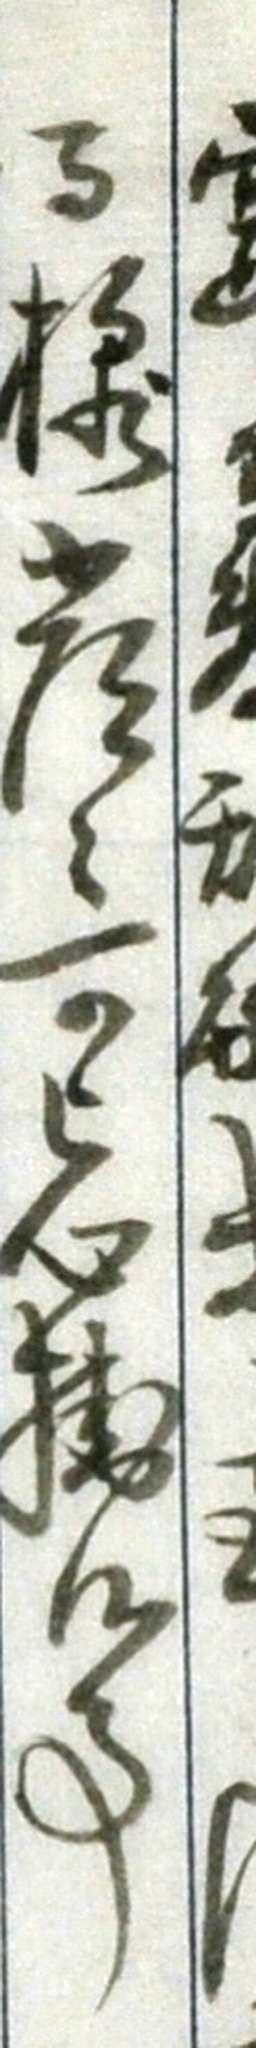る様常々可被心掛候事
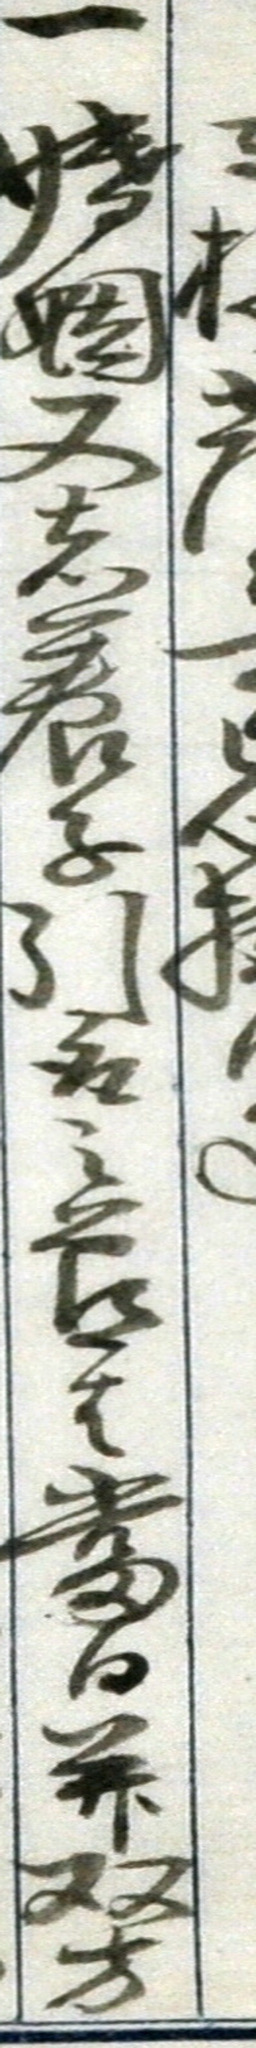一婚姻又は養子引取之節は当日并双方
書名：御倹約被仰出書
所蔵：伊那市立高遠町図書館・合同会社AMANE
